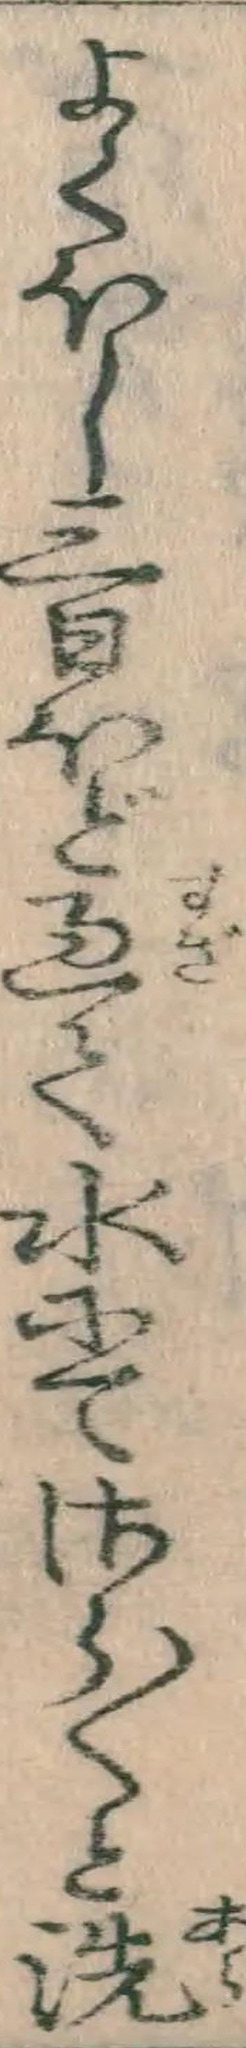よくほし三日ほど過て水にてさら〳〵と洗
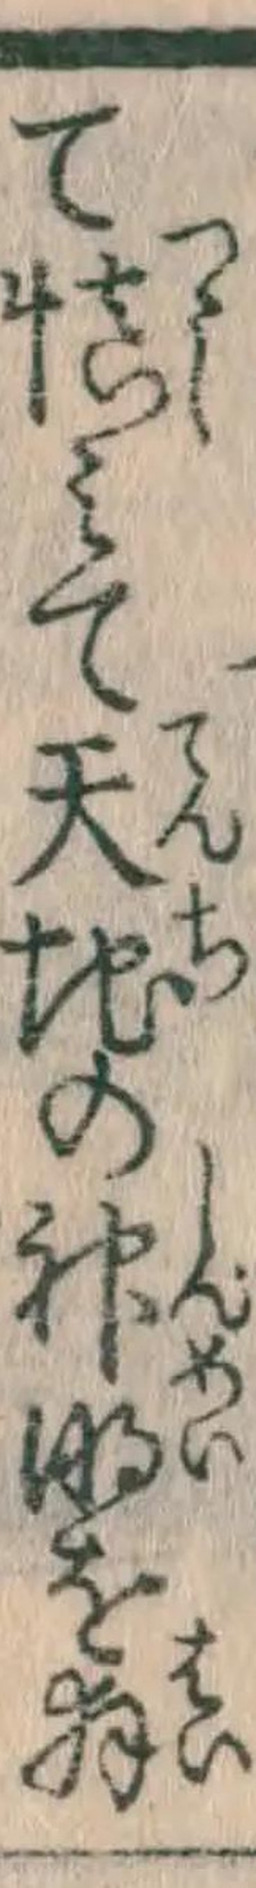て慎みて天地の神明を拝
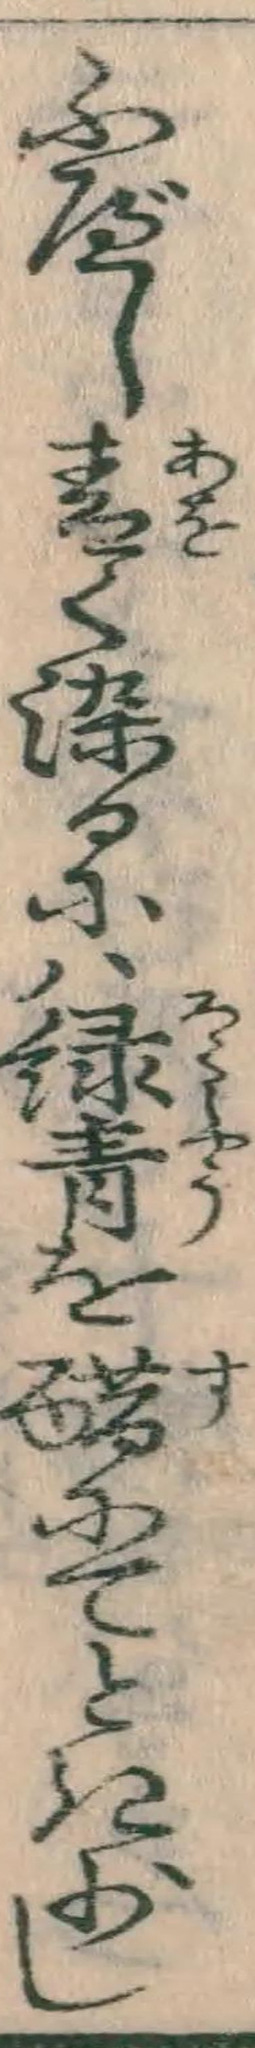ふべし青く染るには緑青を醋にてとき少し
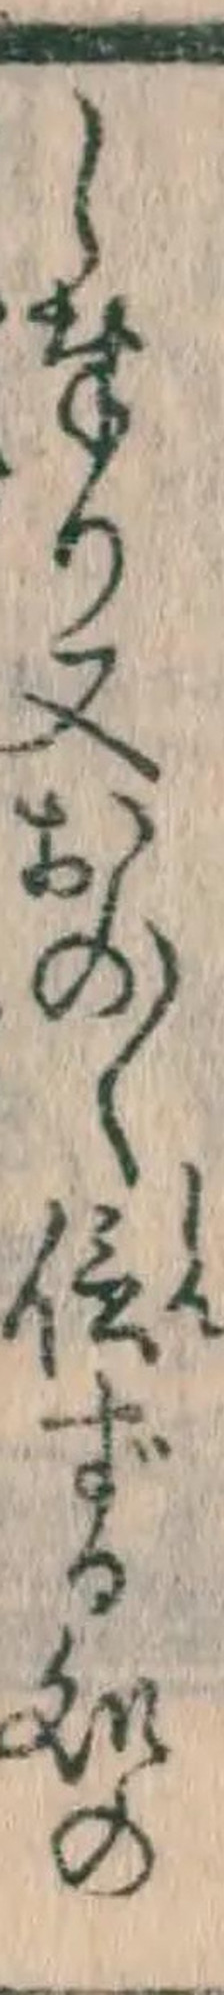し奉り又おの〳〵信ずる処の
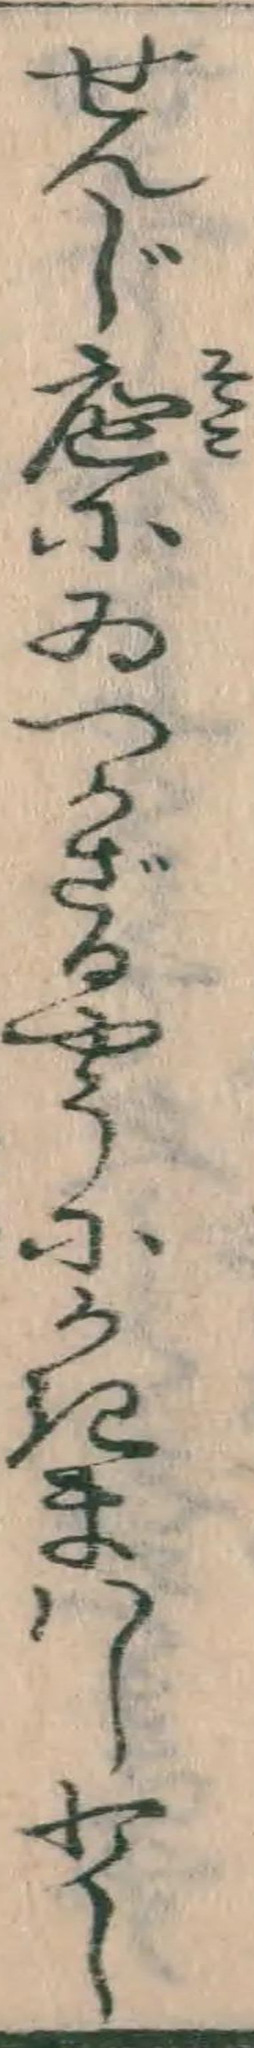せんじ底にゐつかざるやうにかきまはし少し
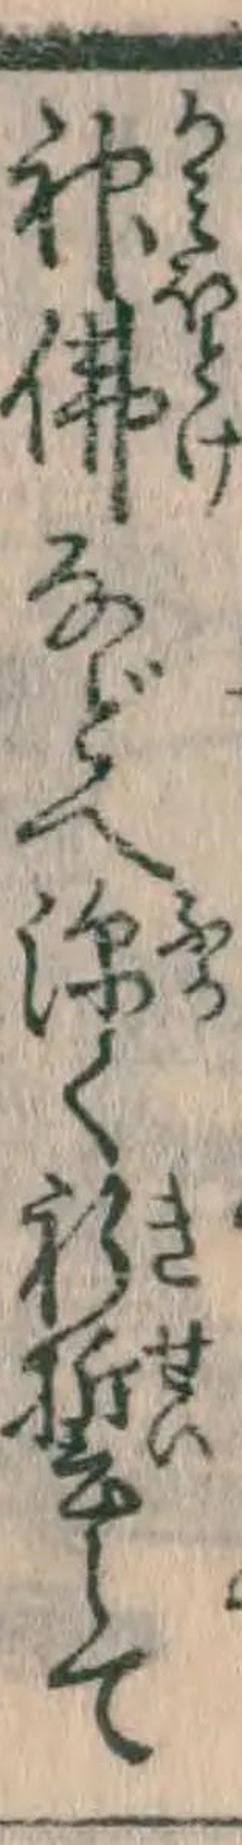神仏などへ深く祈誓して
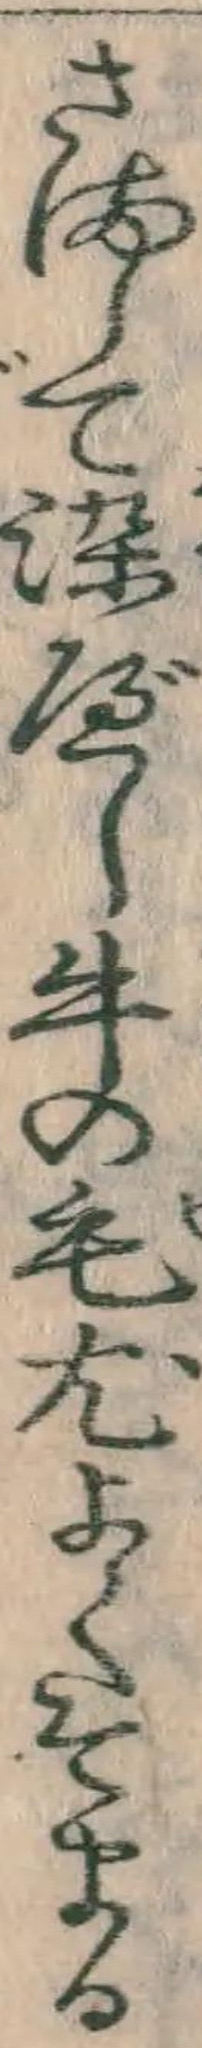さまして染べし牛の毛尤よくそまる
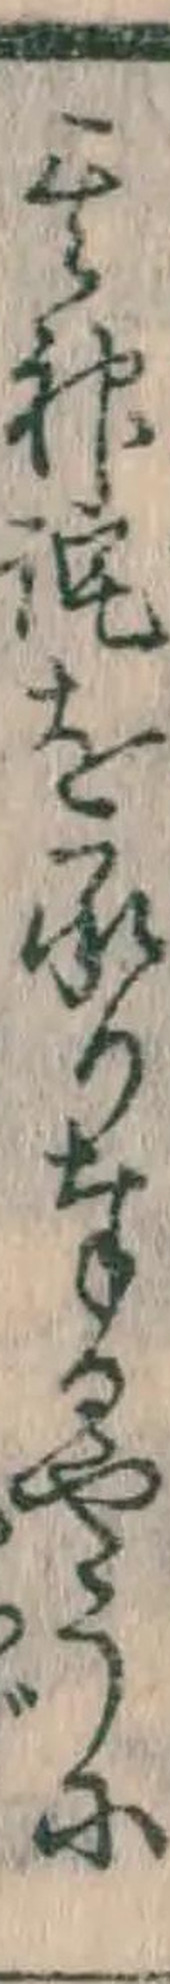其神託を承り奉るやうに
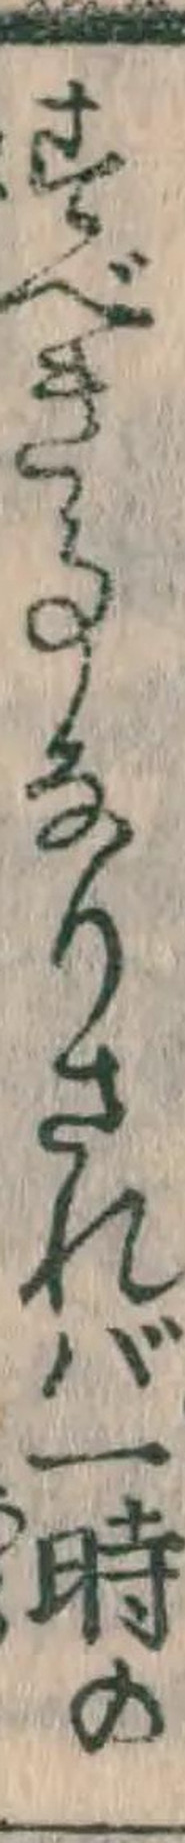すべき事なりされば一時の
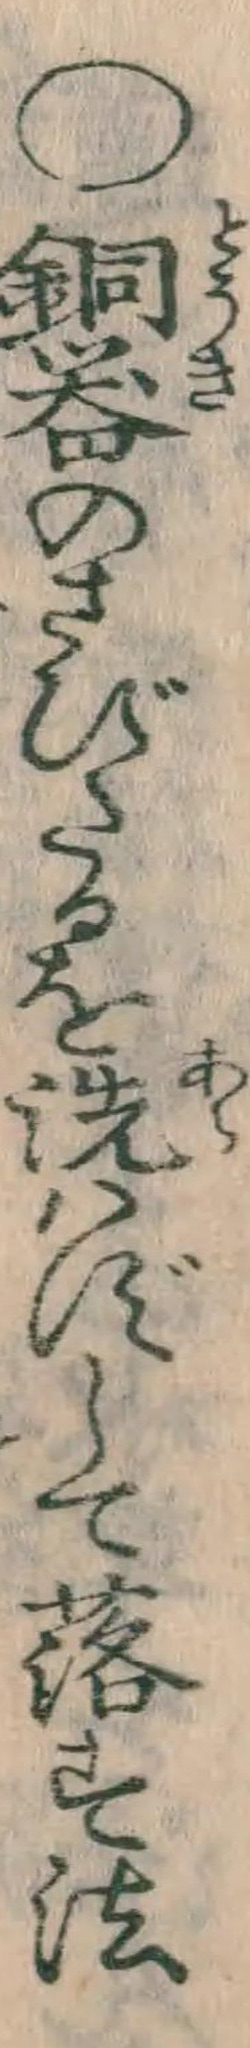○銅器のさびたるを洗はずして落す法
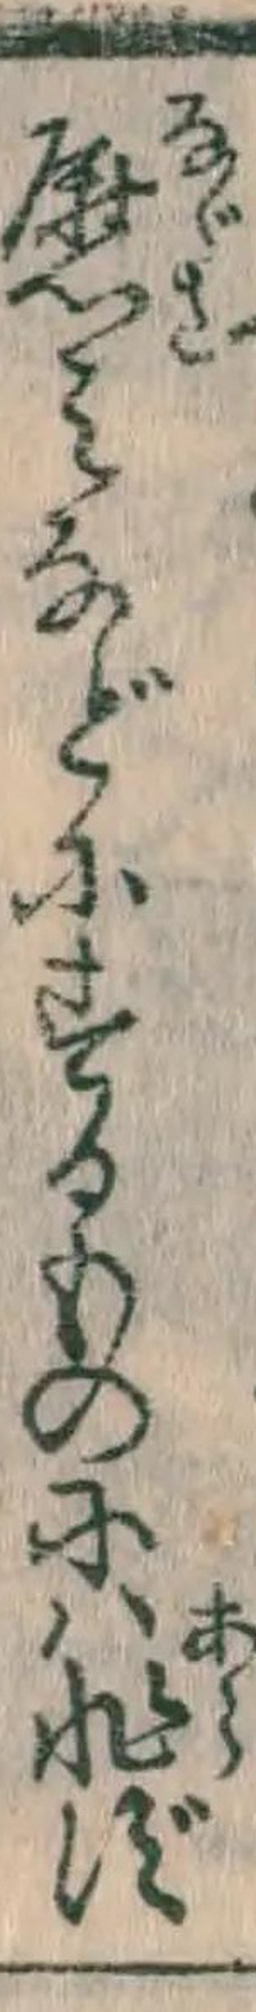慰みなどにするものには非ず
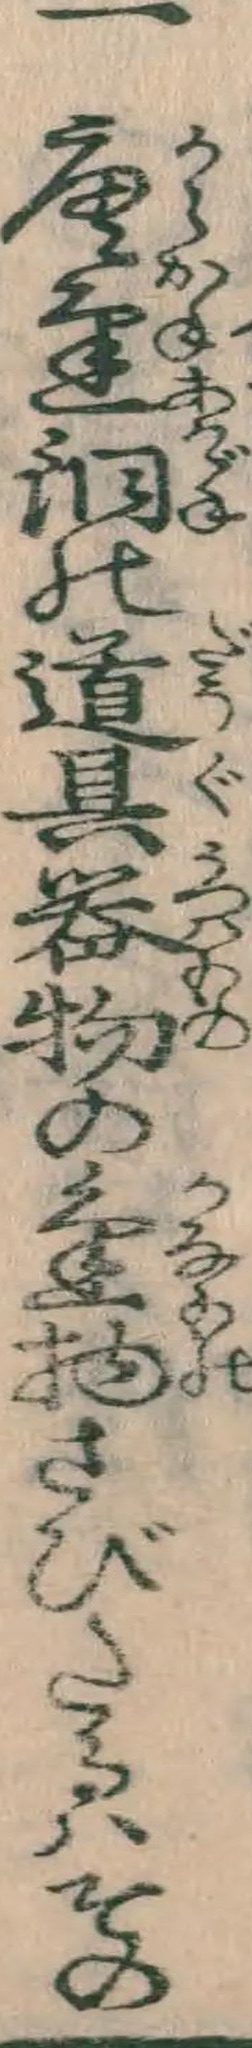一唐金銅の道具器物の金物さびたるはその
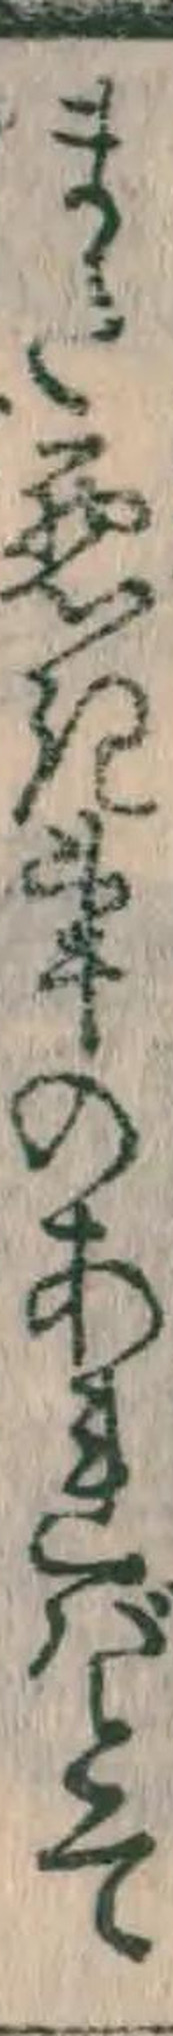また悪き事のあればとて
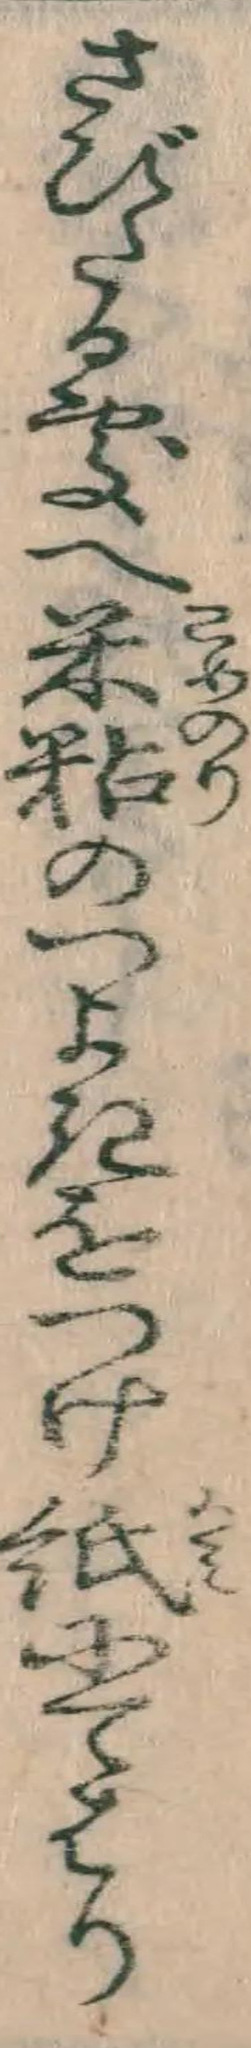さびたる処へ米粘のつよきをつけ紙にてはり
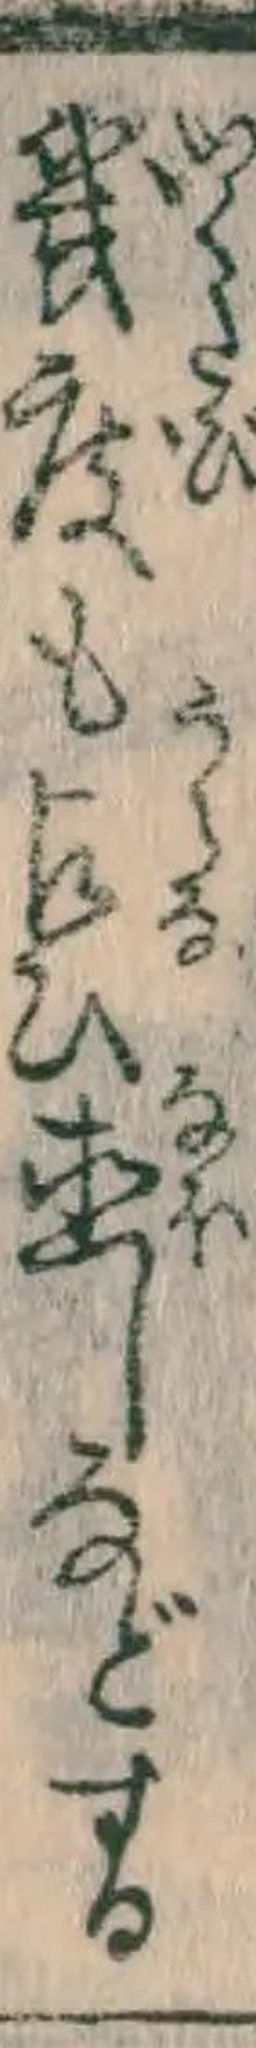幾度も占ひ直しなどする
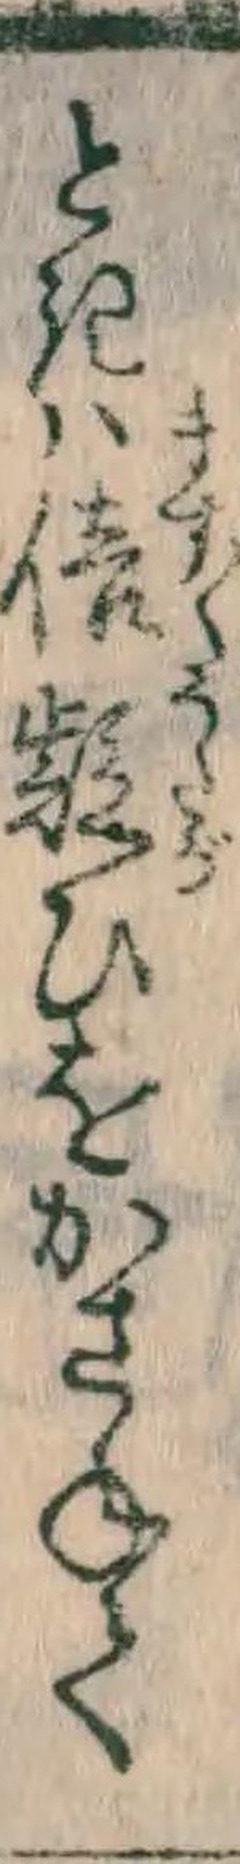ときは倍疑ひをかさねて
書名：広益秘事大全 3巻. [1]
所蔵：国立国会図書館 National Diet Library, JAPAN
